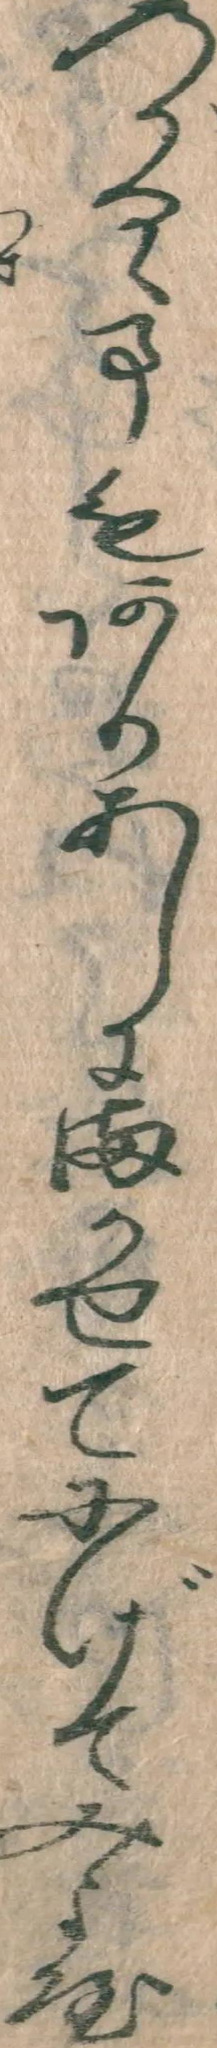のがるゝ事もありあしにまかせてにげてみよや
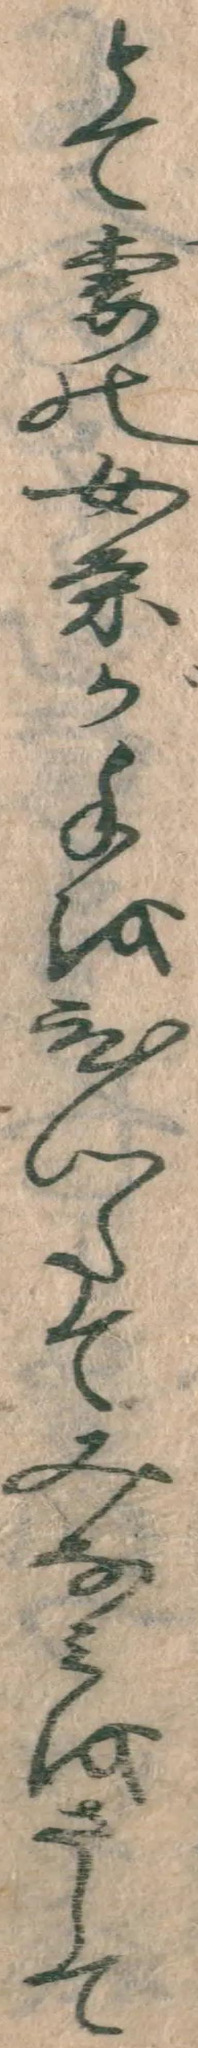とて妻の女房が手をひつたてみなみをさして
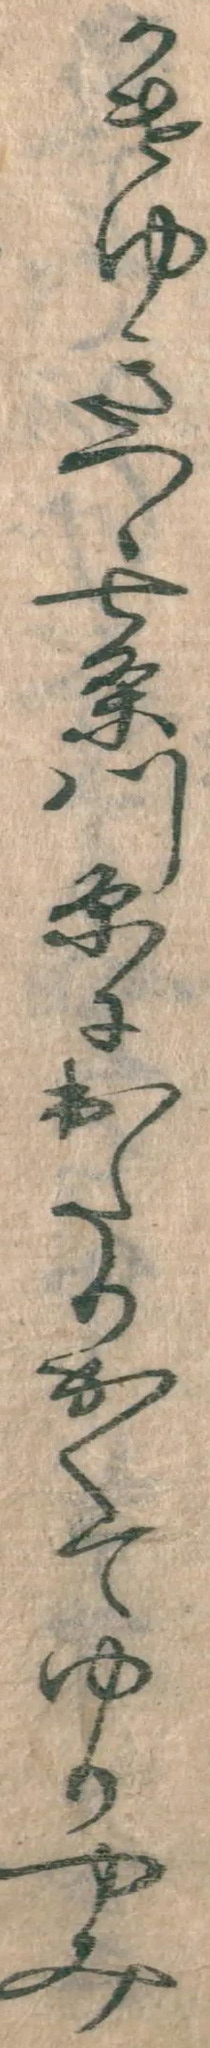かけゆきつゝ七条川原に出たりかくてゆりやみ
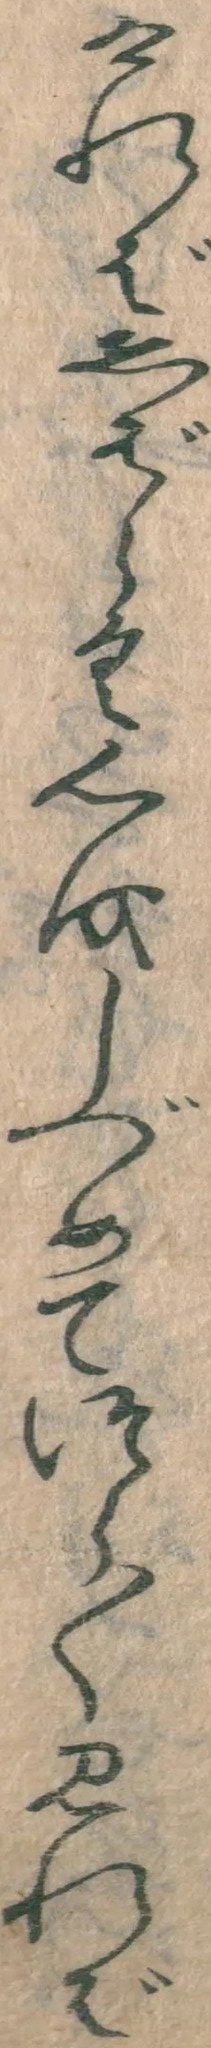ければしばらく心をしづめてつら〳〵見れば
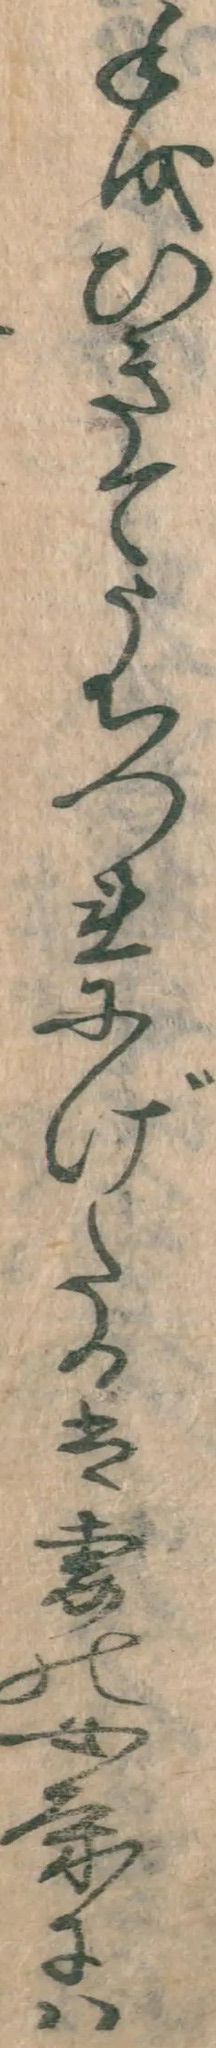手をひきてうちつれにげたるは妻の女房には

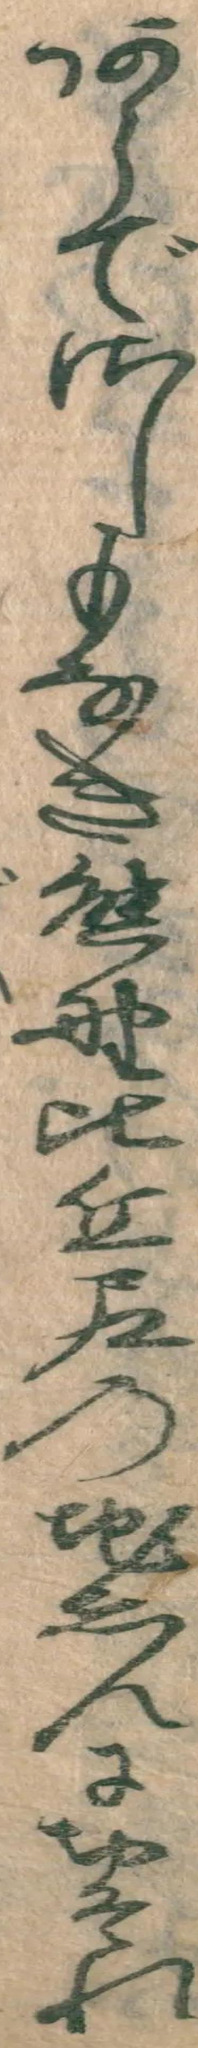あらでさしもなき熊野比丘尼の地しんにおそれ
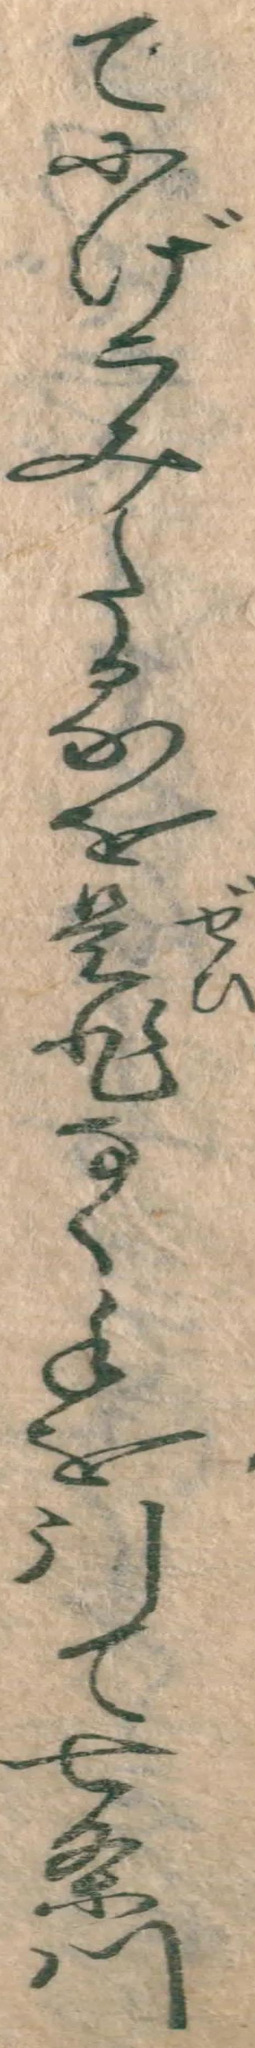てにげこみたるを是非なく手を引てし七条川
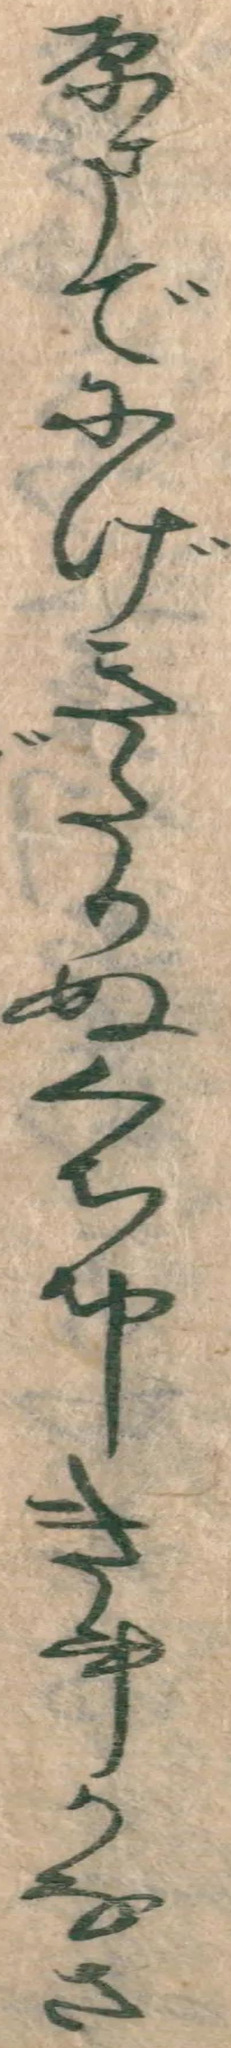原までにげきたりぬくちおしき事かなさ
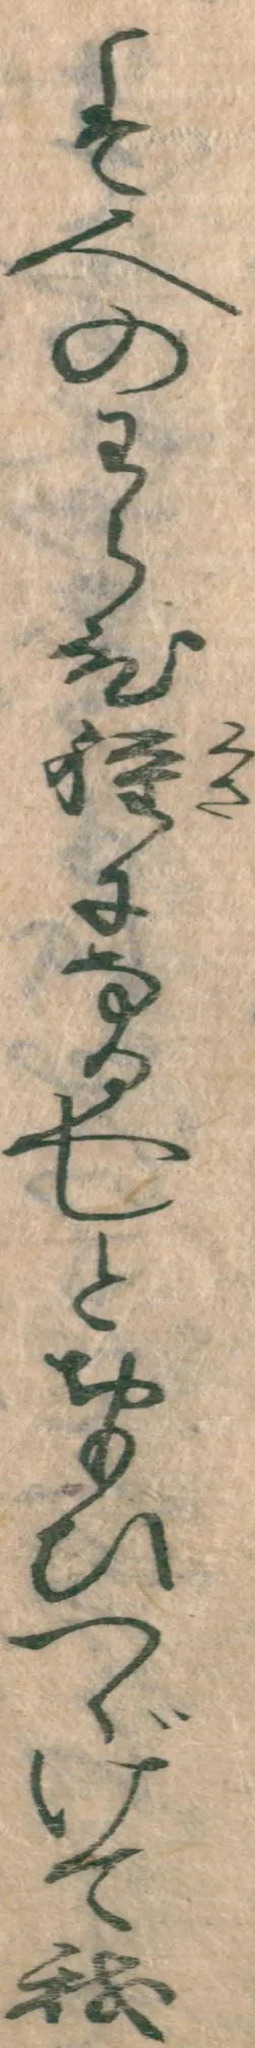こそ人のわらひ種になるへしとおもひつゞけて我
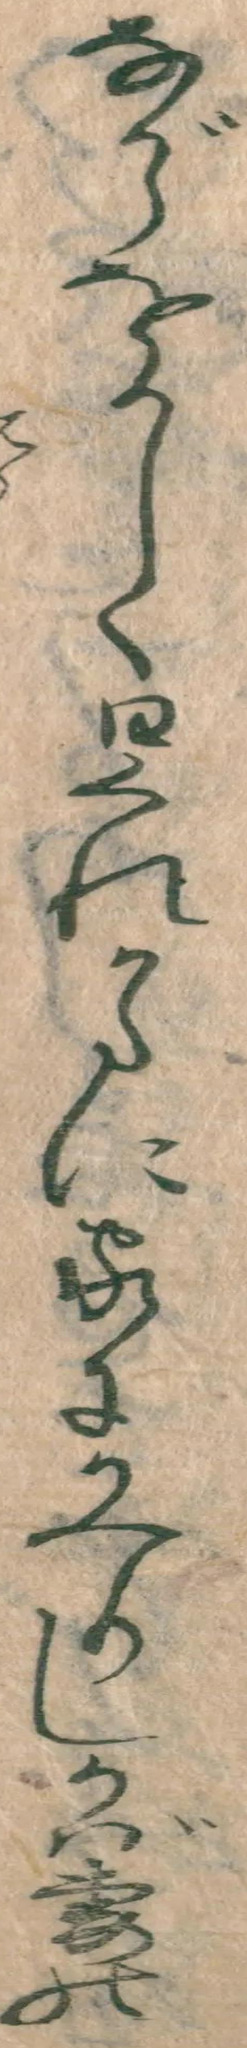ながらをかしく日くれかたに家にかへりしかば妻の
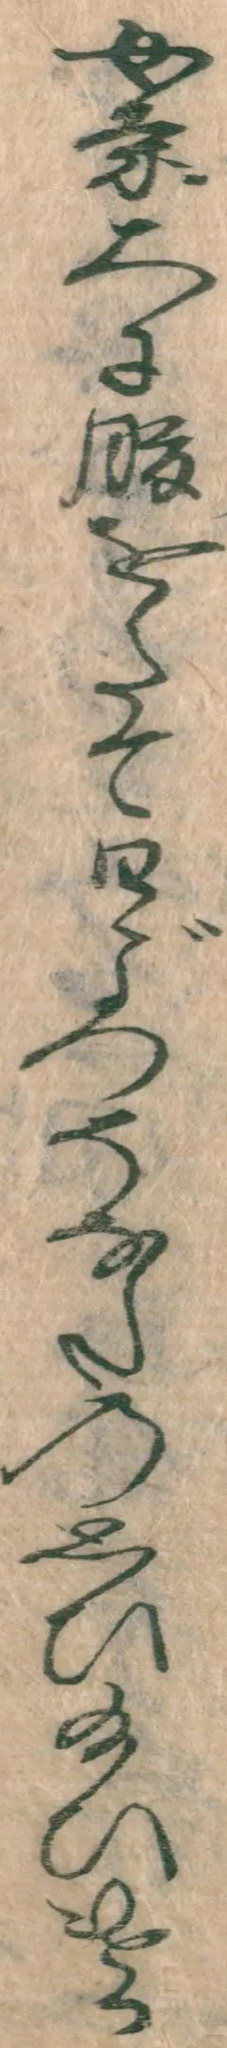女房大に腹をたて日ごろそなたの思ひ給ひける
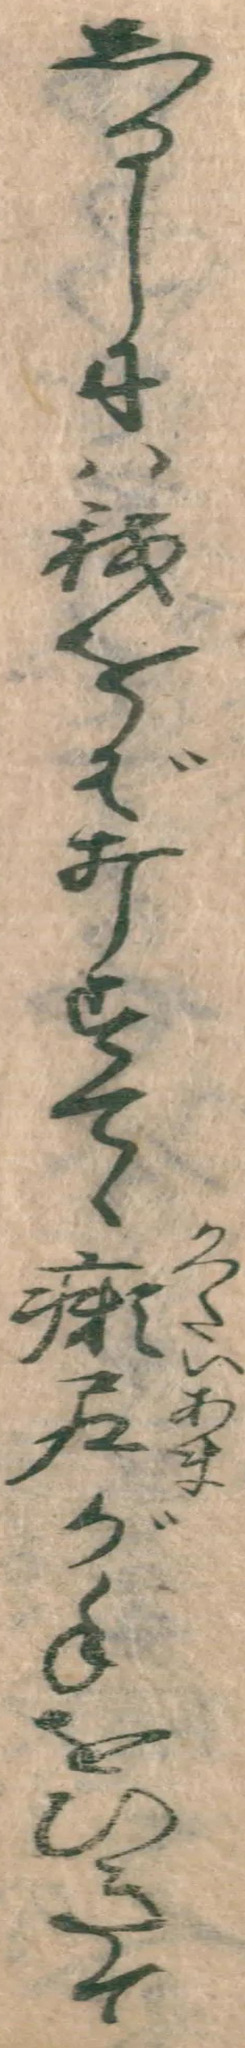しるしには我をば打すてゝ癩尼が手をひきて
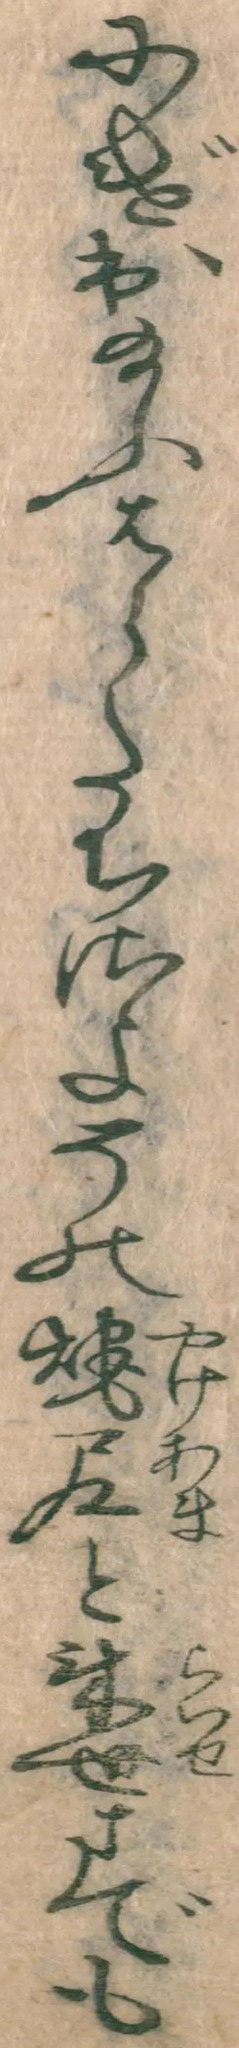にげ出給ふはらたちさようの焼尼と来世までも
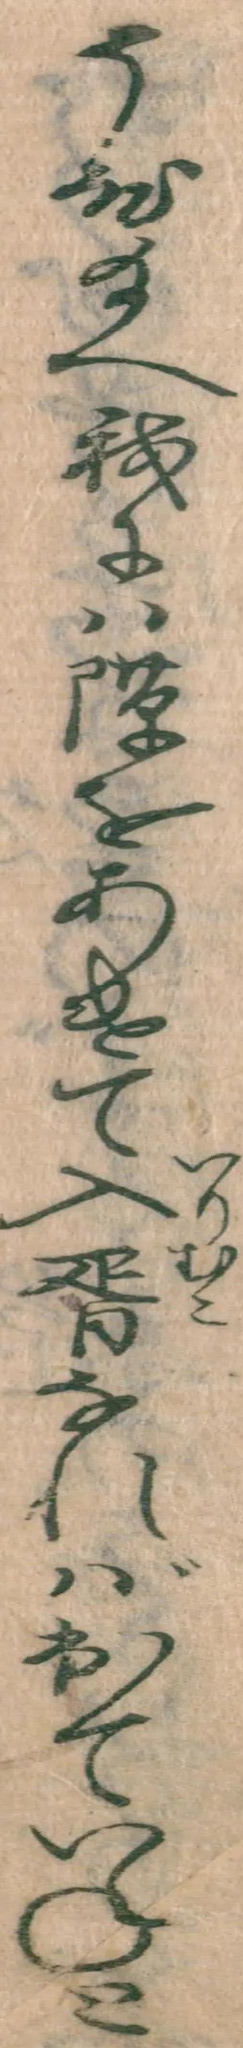そひ給へ我には隙をあけて入婿なれば出ていねと
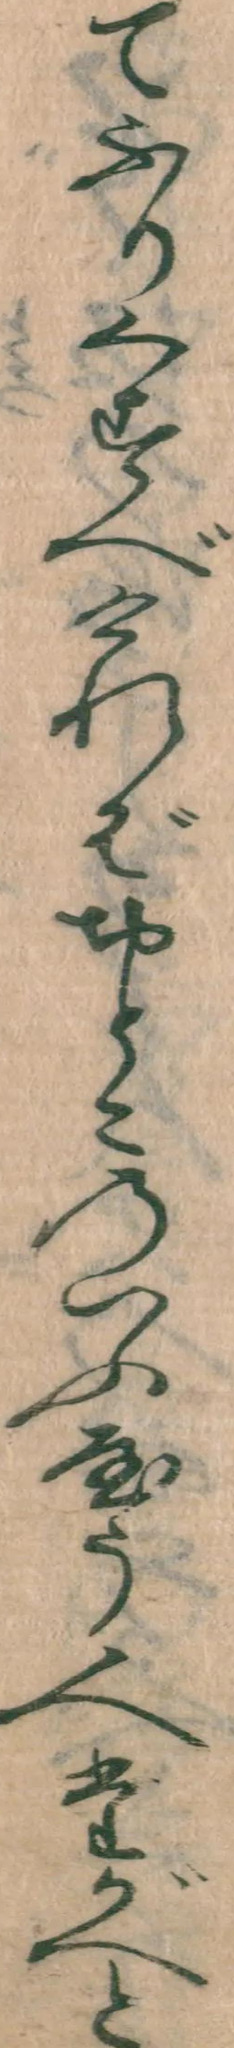てふりくすべければおとこのいふやう人たがへと
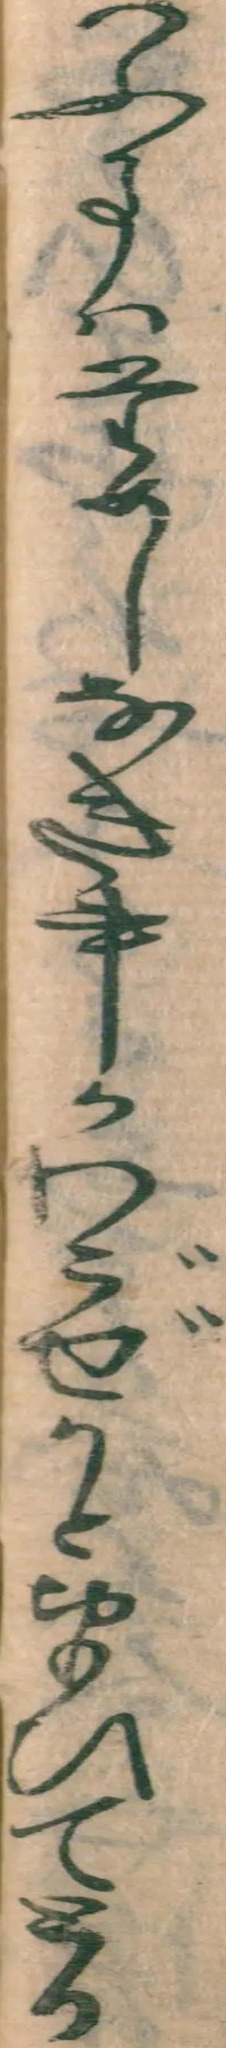かふにはためしなき事かわごぜかとおもひてとり
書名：艱難目異志. 上,下
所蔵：国立国会図書館 National Diet Library, JAPAN
